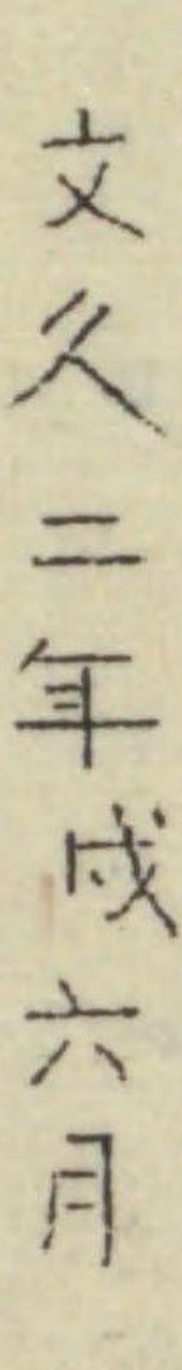文久二年戌六月

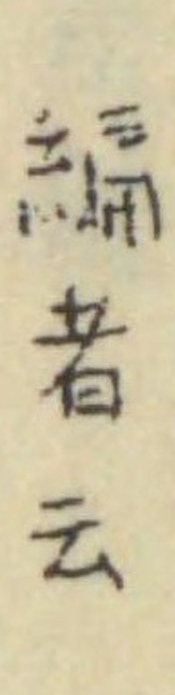編者云
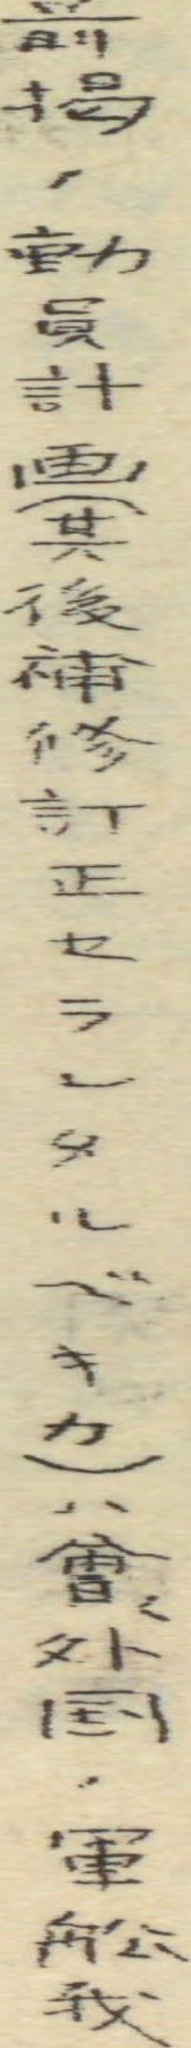前掲ノ動員計画(其後補修訂正セラレタㇽベキカ)ハ曾く外国ノ軍船我
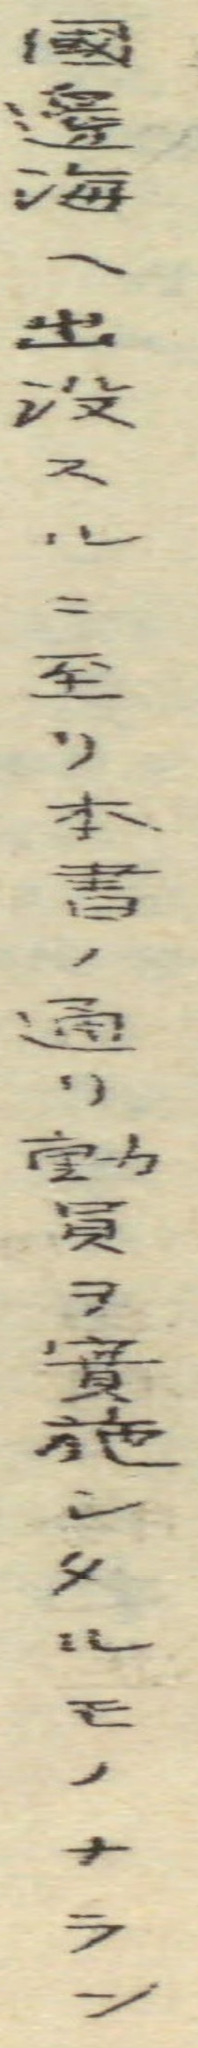国辺海へ出没スルニ至り本書ノ通り動員ヲ実施シタㇽモノナラン
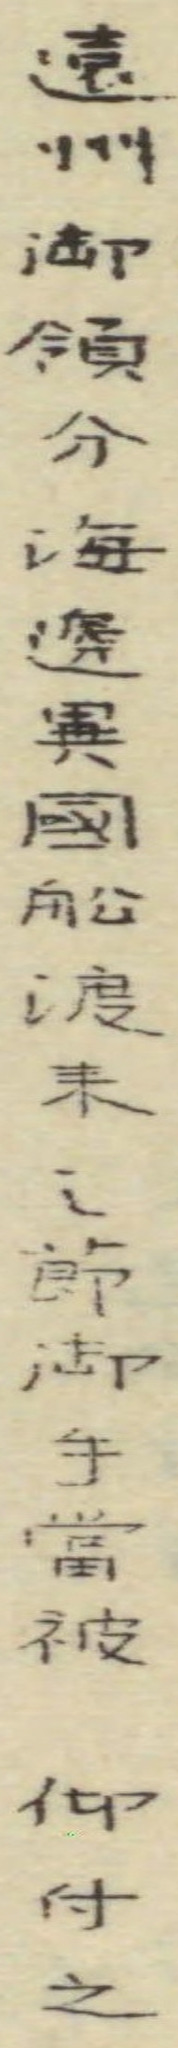遠州御領分海辺異国船渡来之節御手当被仰付之
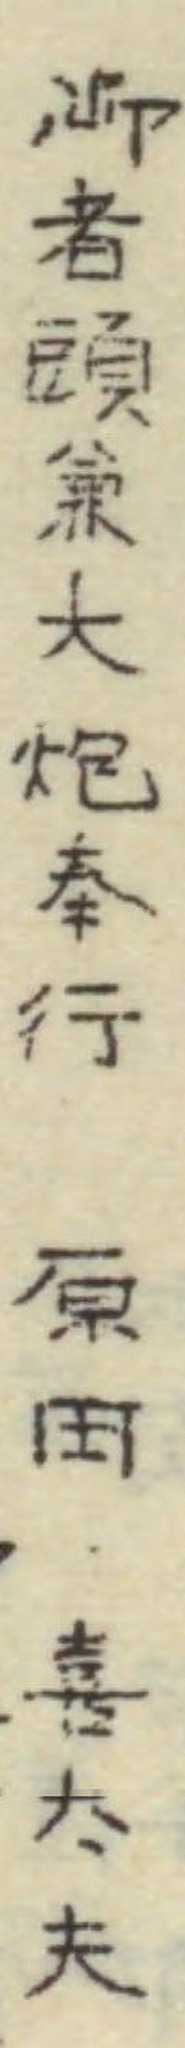騎馬御者圖兼大炮奉行原田喜太夫
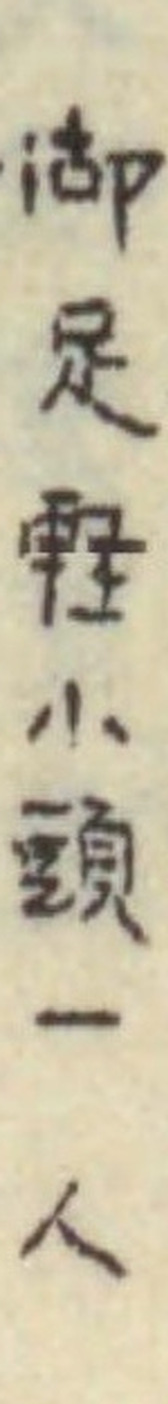御足軽小頭一人
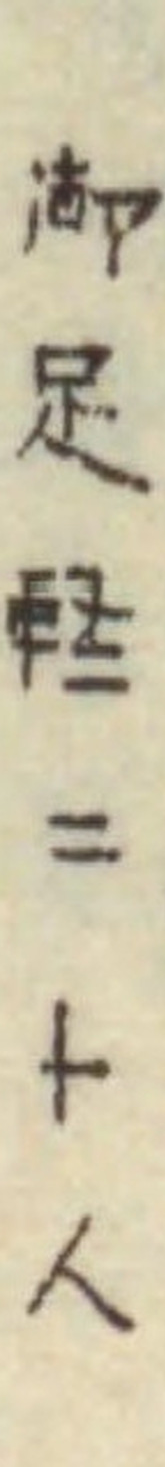御足軽二十人
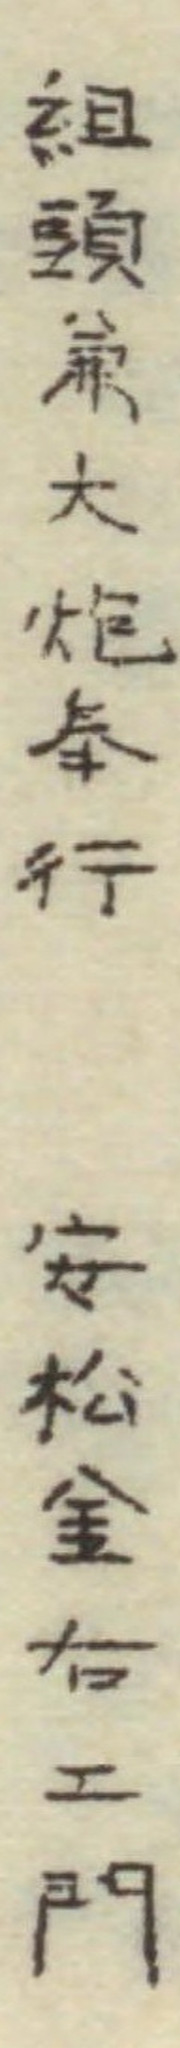騎馬組頭兼大炮奉行安松金右エ門
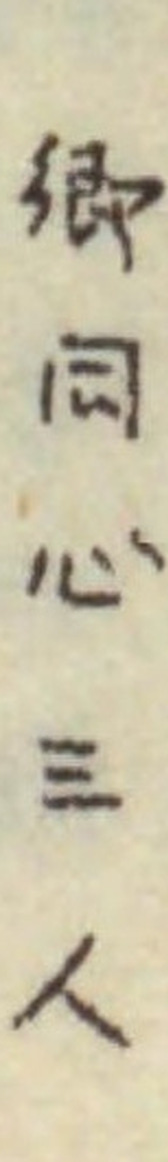御同心三人
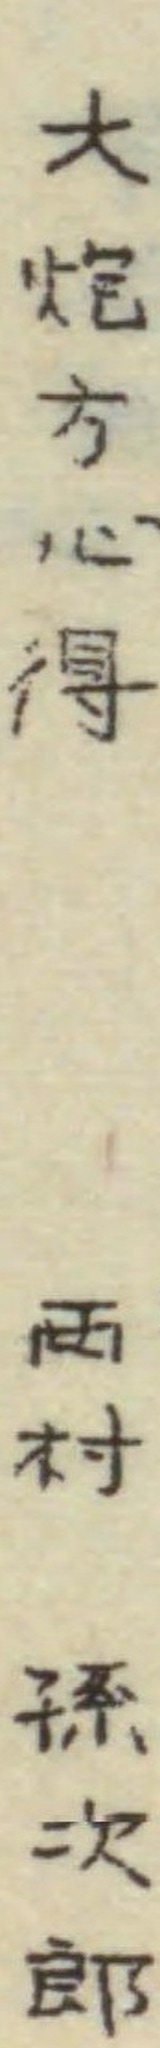大炮方心得西村孫次郎
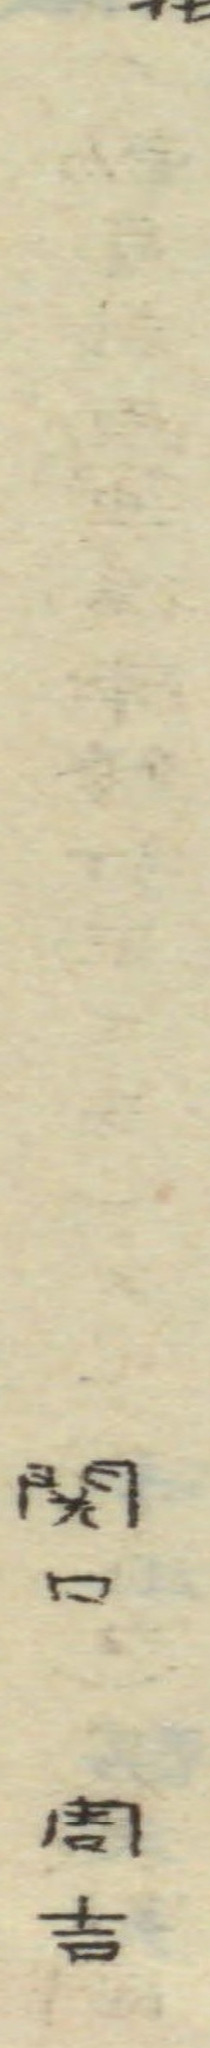関口周吉
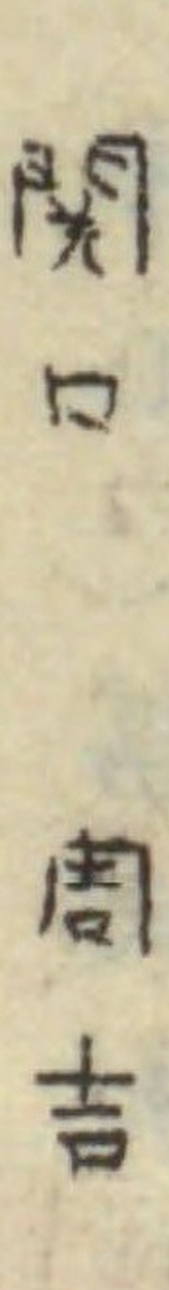関口周吉
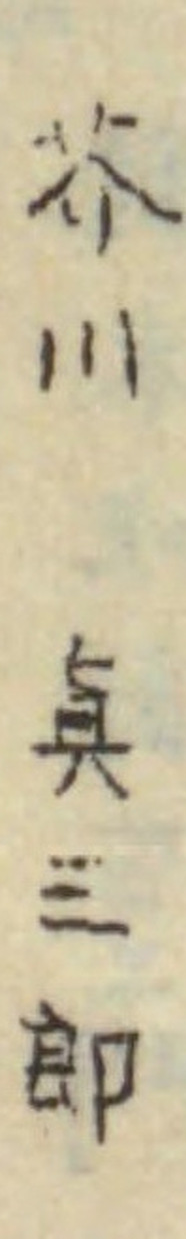芥川真三郎

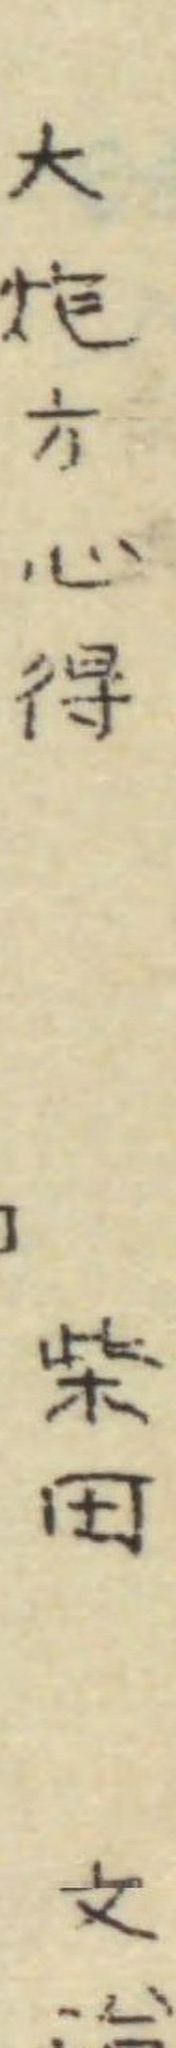大炮方心得柴田文治
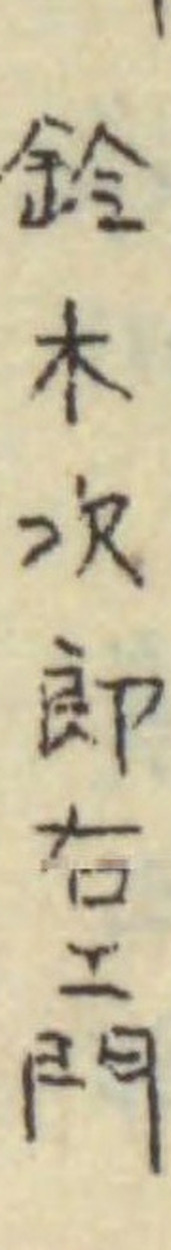鈴木次郎右エ門
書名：三河吉田藩動員史料
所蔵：国立国会図書館 National Diet Library, JAPAN
